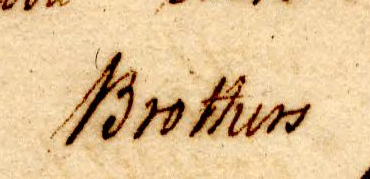Brothers
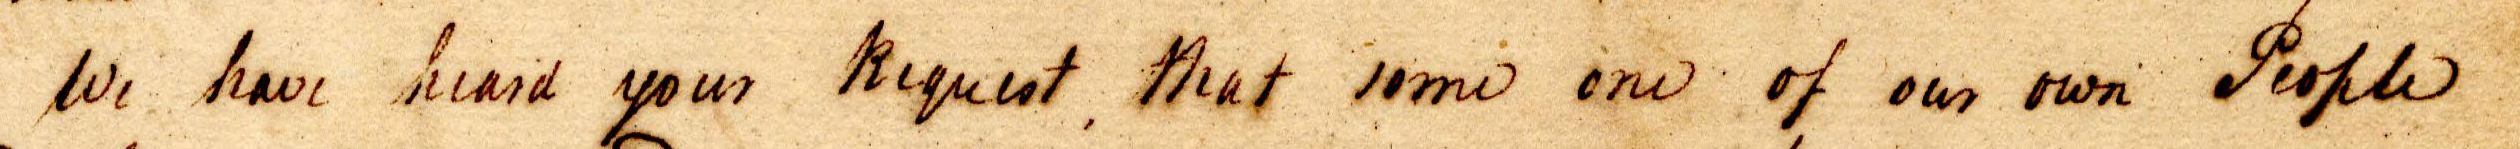We have heard your Request that some one of our own People
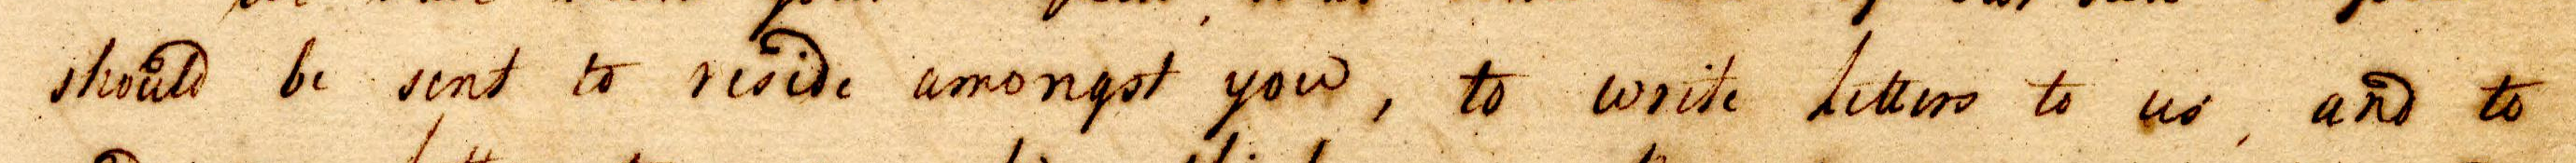should be sent to reside amongst you, to write Letters to us and to
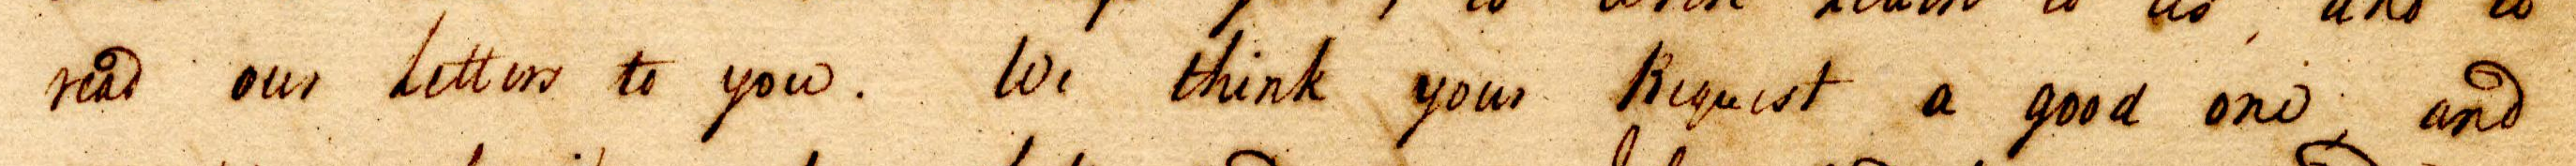read our Letters to you. We think your Request a good one, and
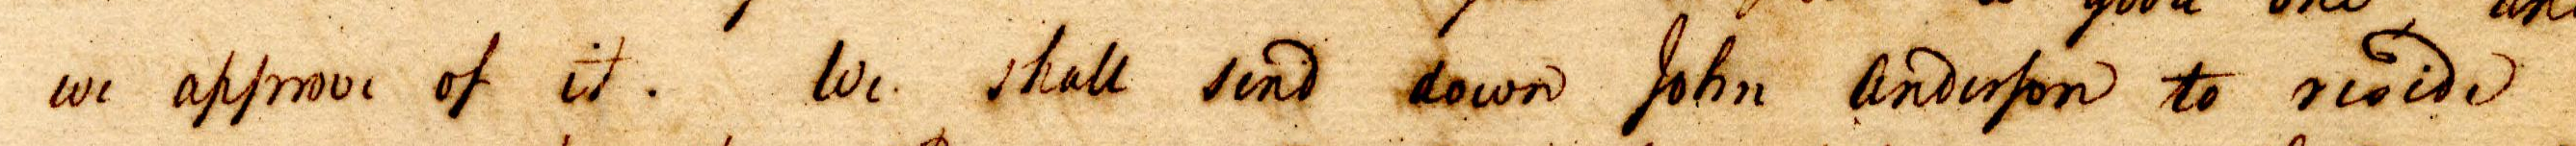we approve of it. We shall send down John Anderson to reside
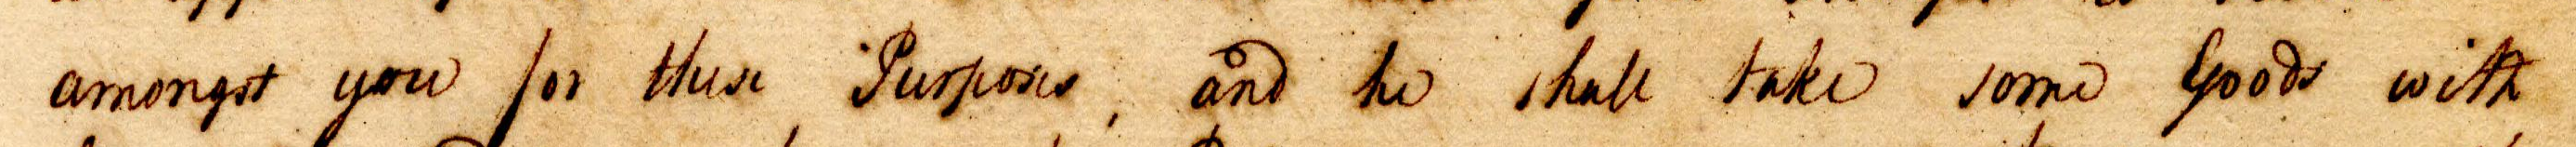amongst you for these Purposes, and he shall take some Goods with
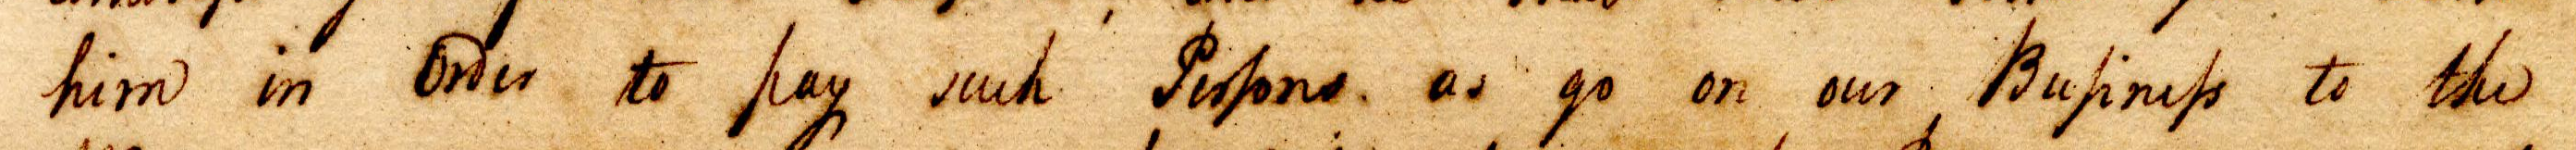him in order to pay such Persons as go on our Business to the
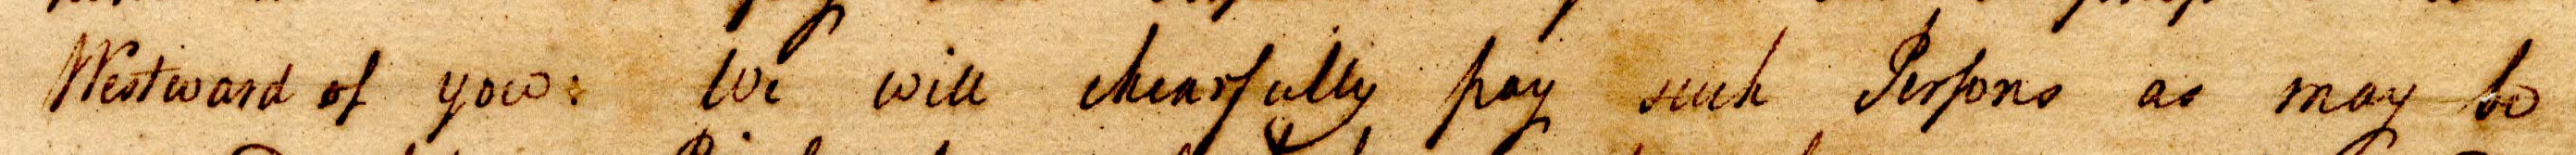Westward of you. We will cheerfully pay such Persons as may be
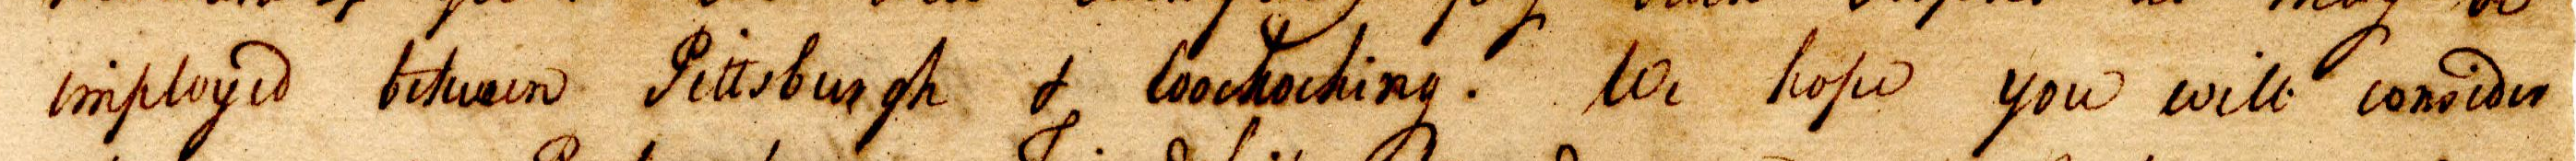imployed between Pittsburgh & Coockoching. We hope you will consider
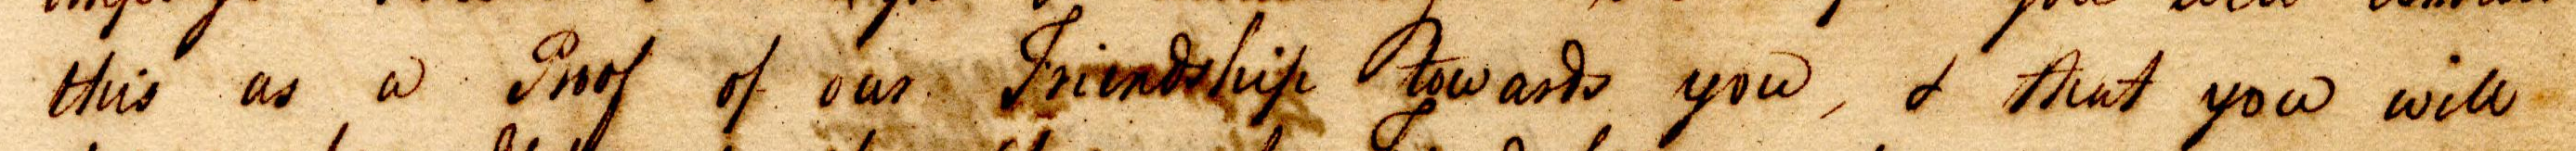this as a Proof of our Friendship towards you, & that you will
